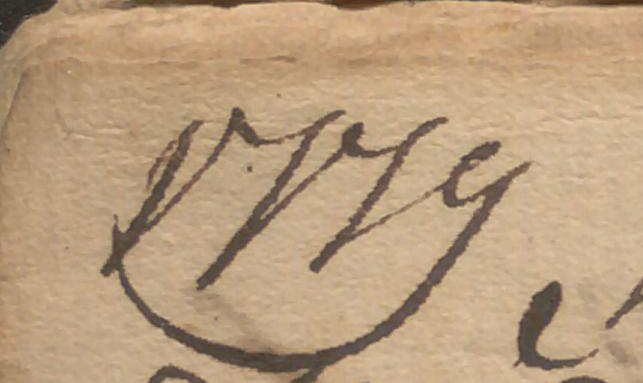1779
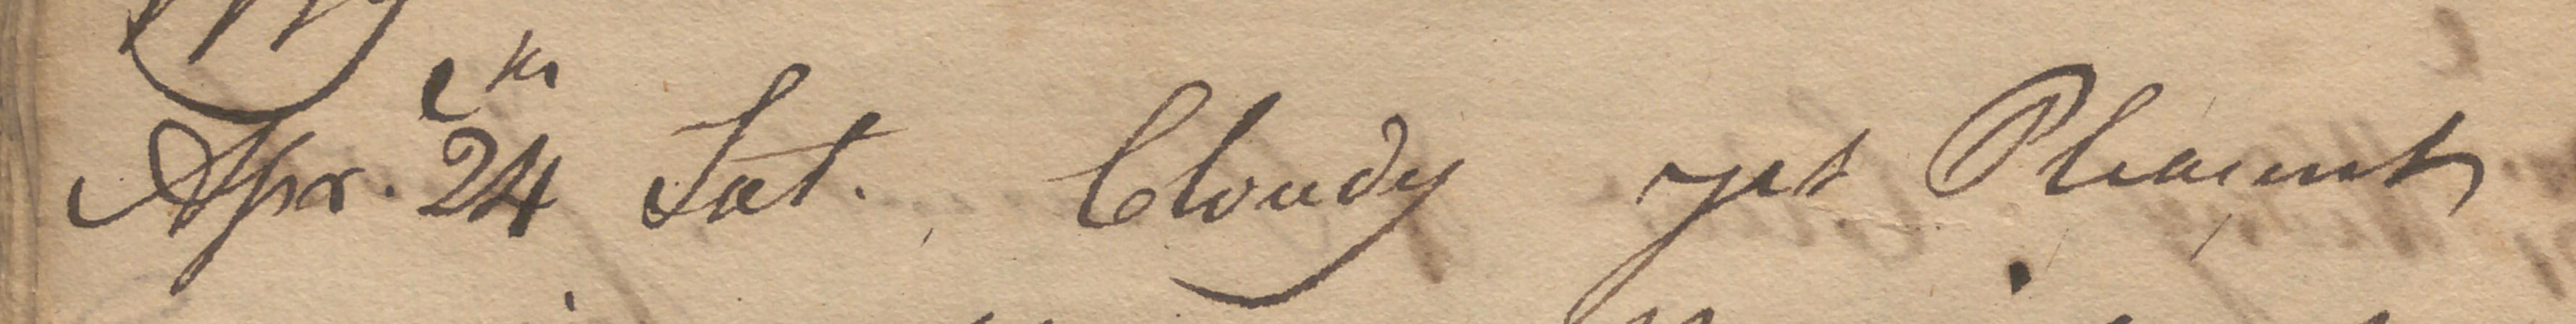Apr^l. 24^th Sat. Cloudy yet Pleasent
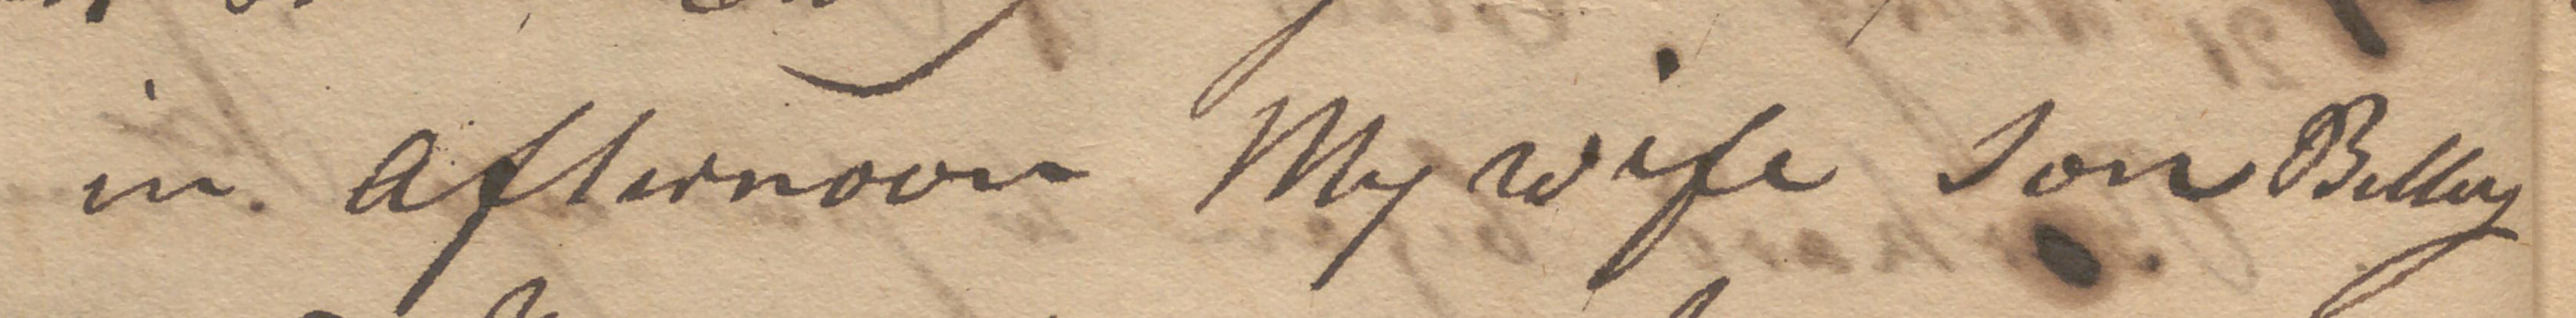in Afternoon My wife Son Billey
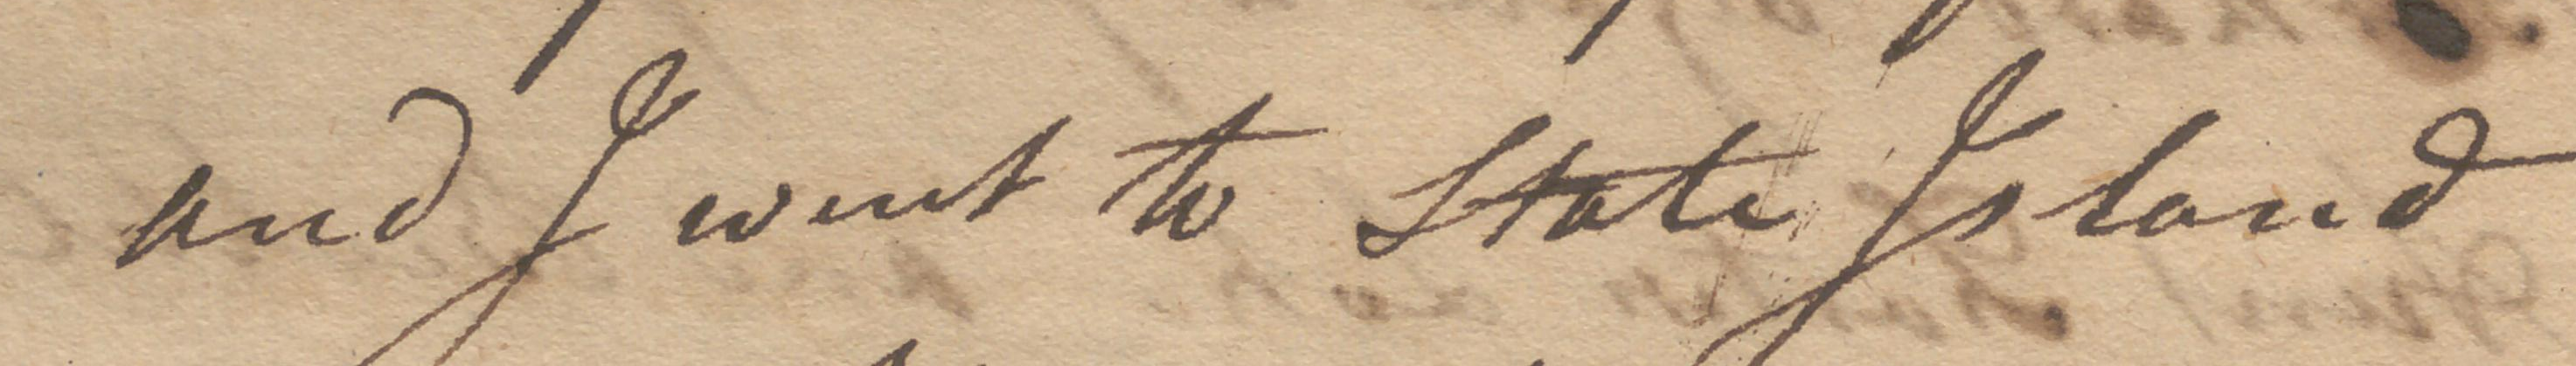and I went to State Island
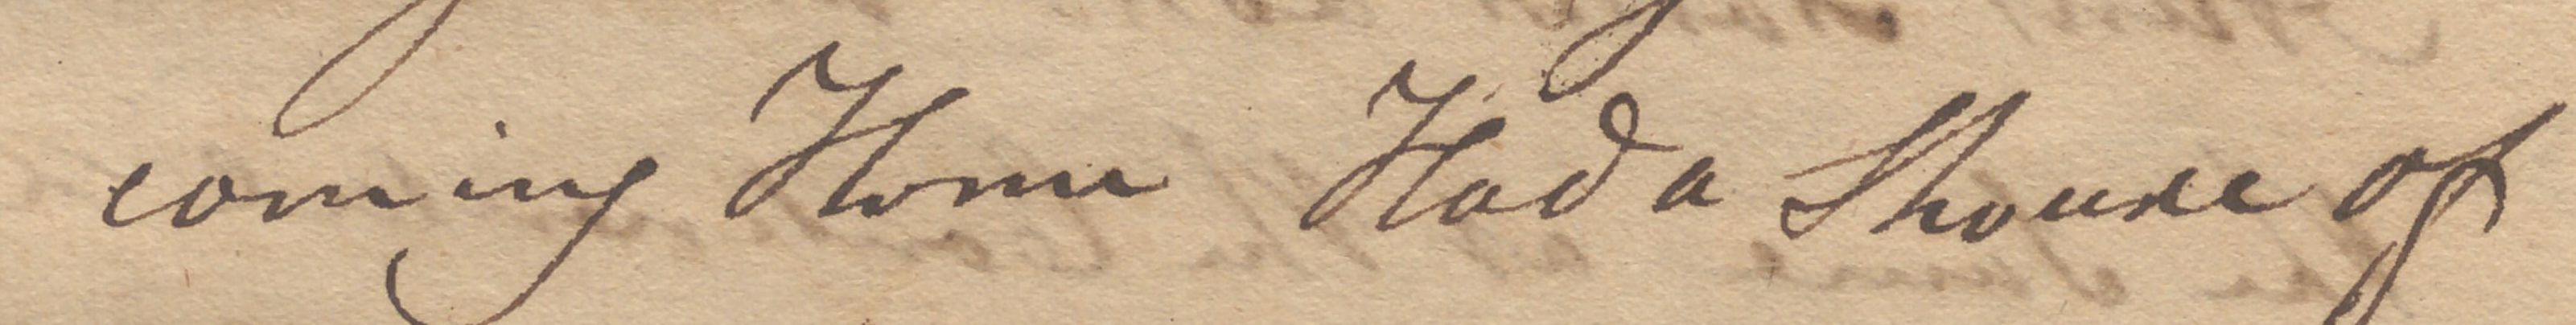coming Home Had a Shoure of
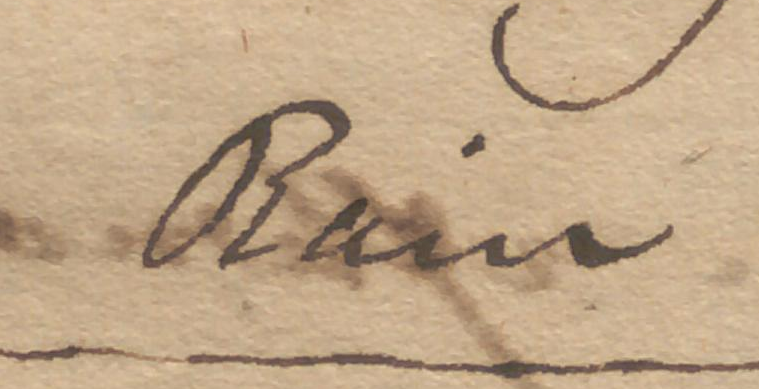Rain
